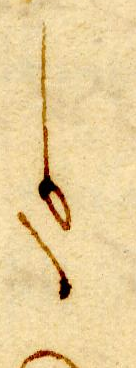To
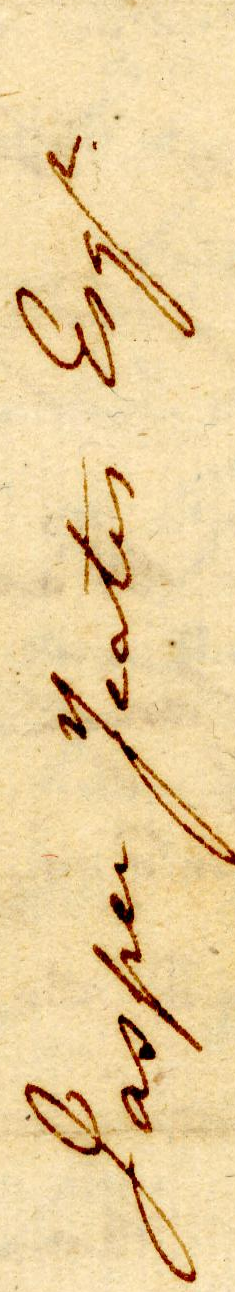Jasper Yeates Esq^r
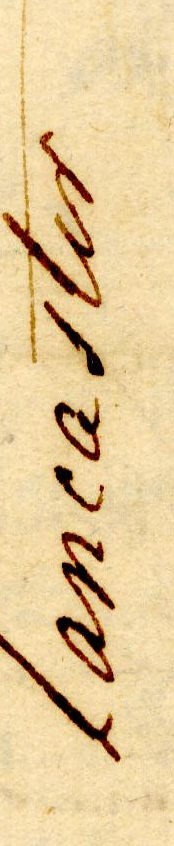Lancaster
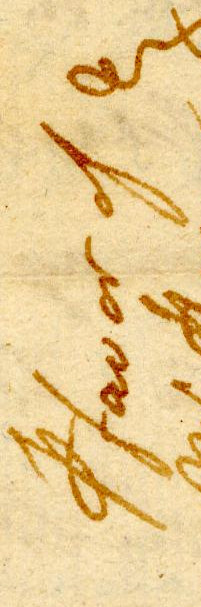Per favor of
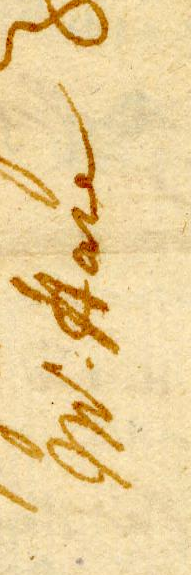M^r. Hare
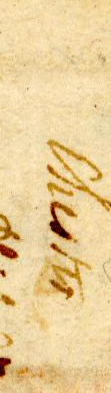Chester
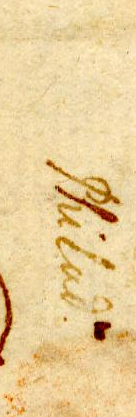Philad^a.
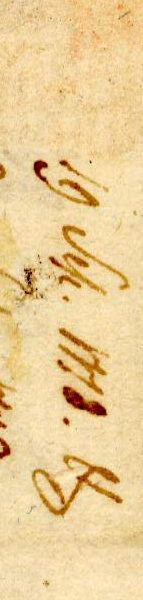19 Sep. 1778. &
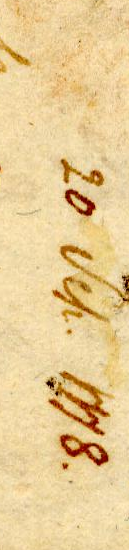20 Sep. 1778.
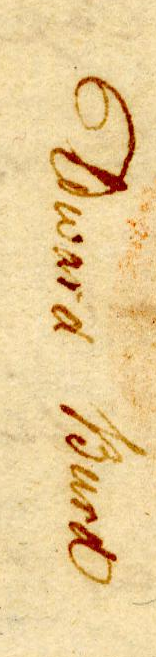Edward Burd
